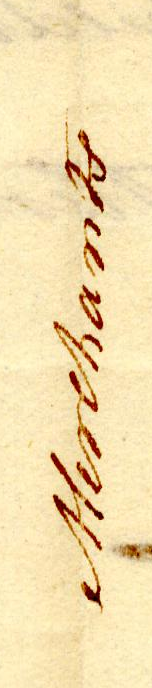Merchants
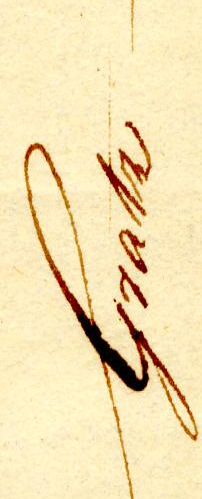Gratz
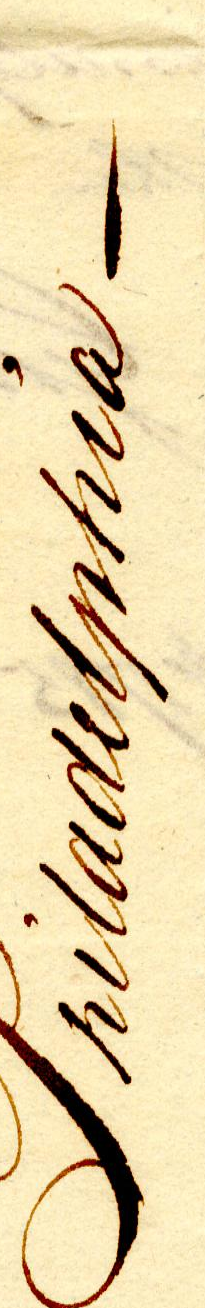Philadelphia-
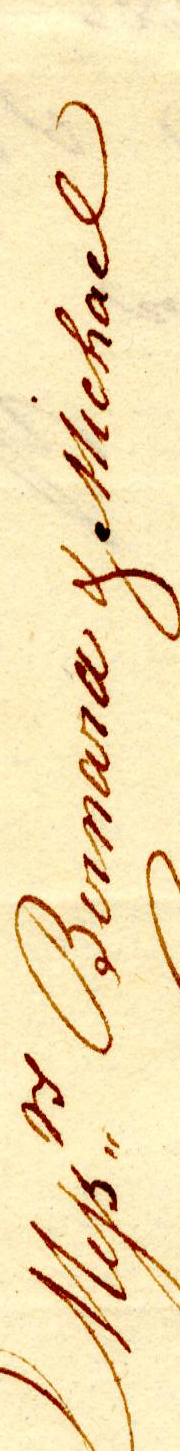Mess^rs Barnard & Michael
